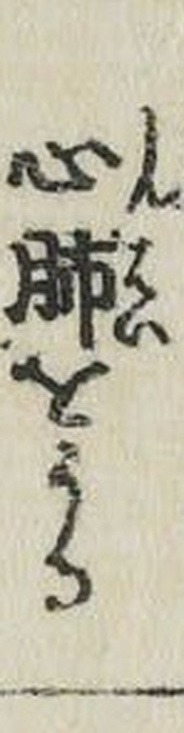心肺をうる
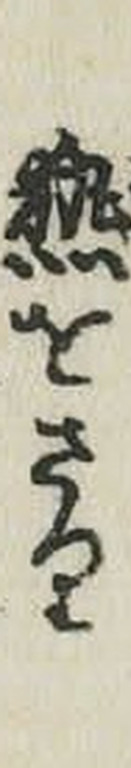熱をさり
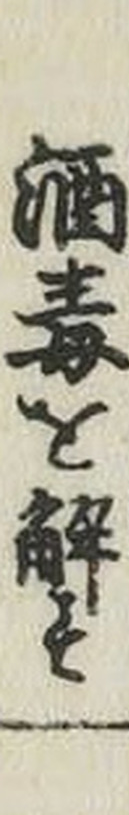酒毒を解す
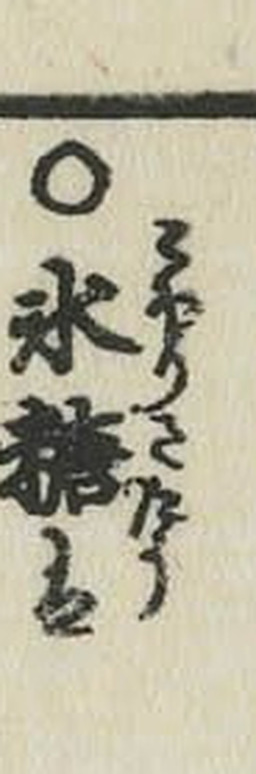○氷糖は
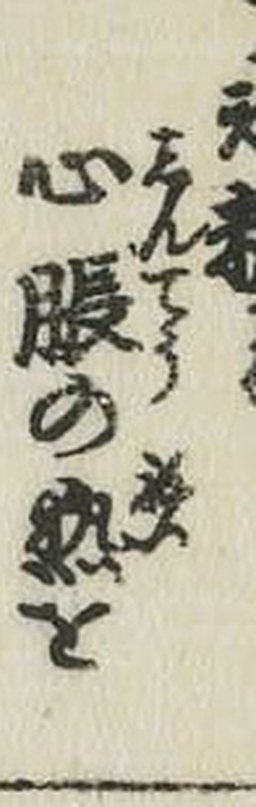心脹の熱を
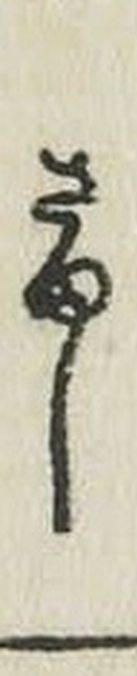さまし
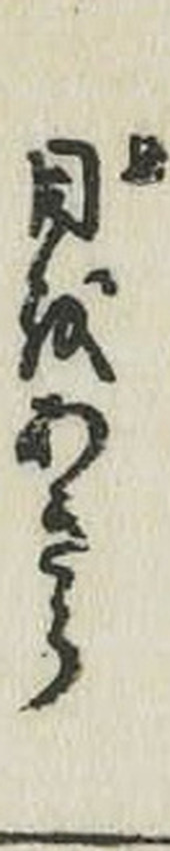目をあきら
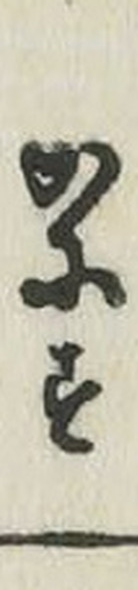かにす
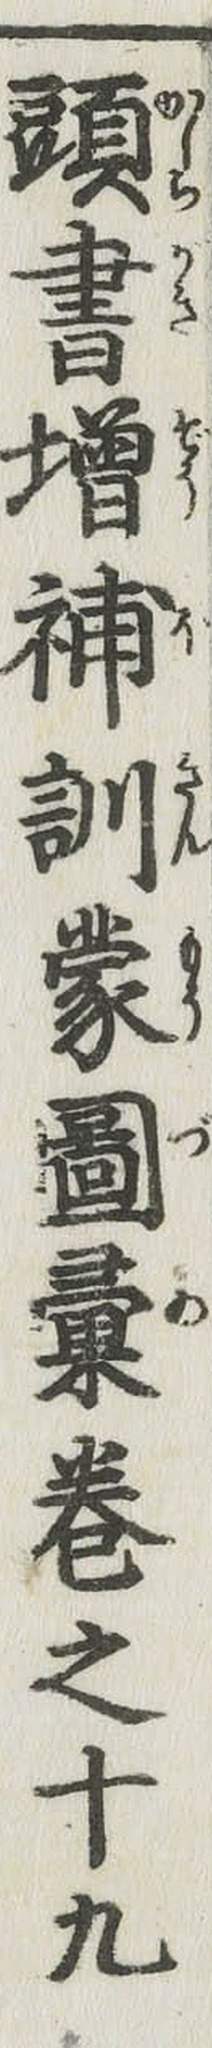頭書増補訓蒙図彙巻之十九
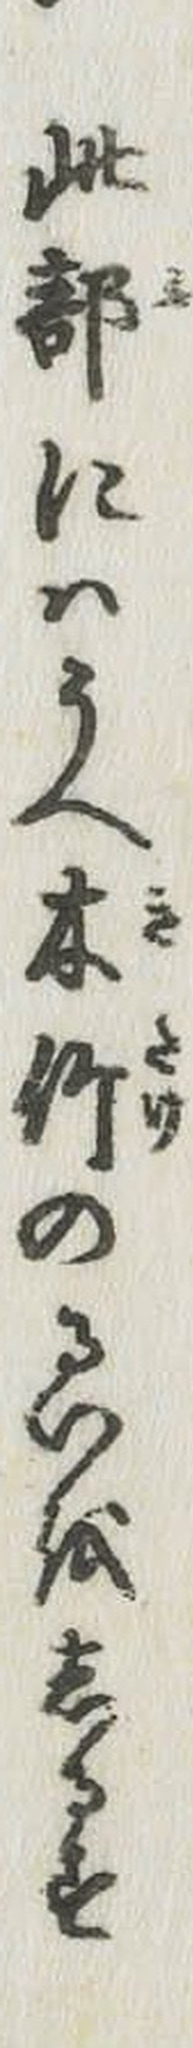此部にはうへ木竹のるいをしるす
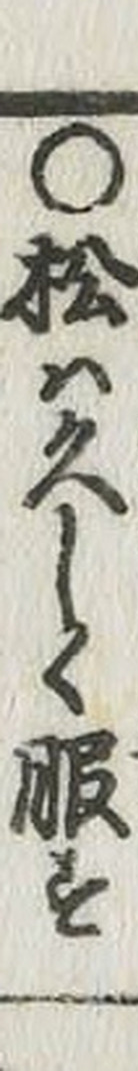○松は久しく服す
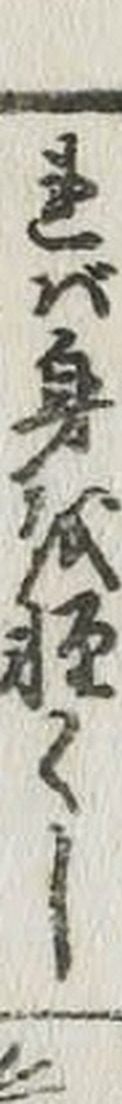れば身を軽くし
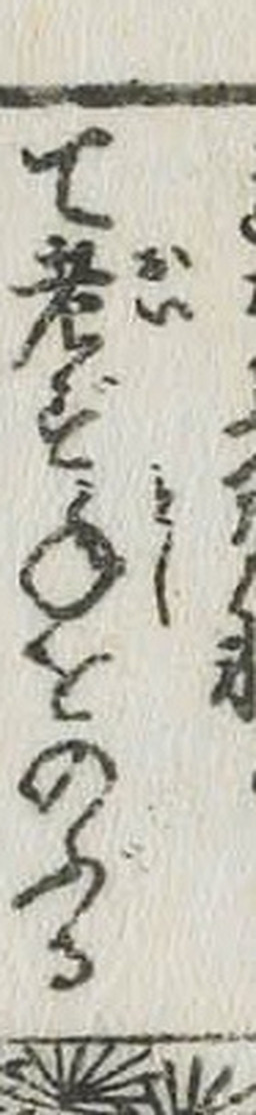て老ず年をのぶる
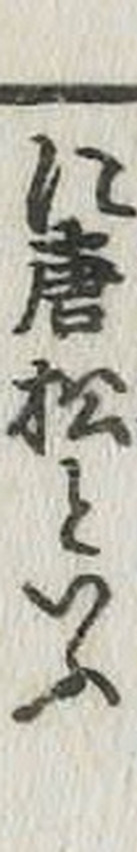に唐松といふ
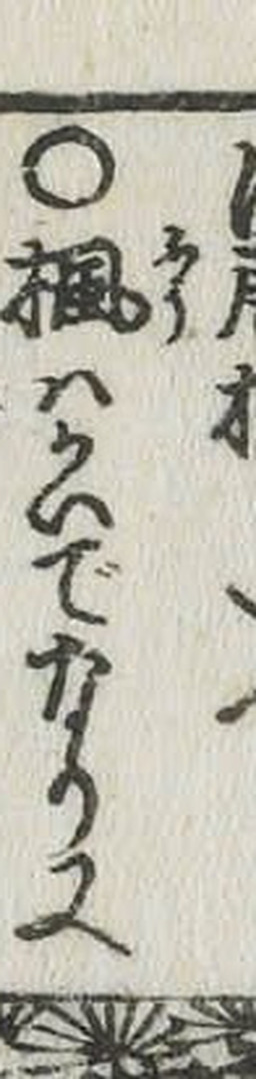○楓はかいでなり又
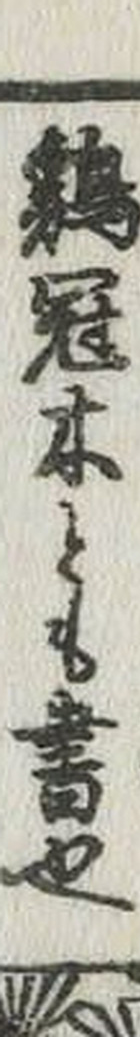鶏冠木とも書也
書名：増補頭書訓蒙図彙大成 10巻 8:巻之17-19
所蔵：東京学芸大学教育コンテンツアーカイブ
